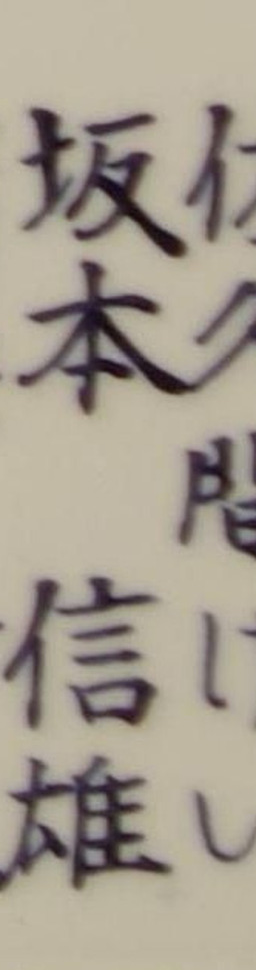坂本信雄
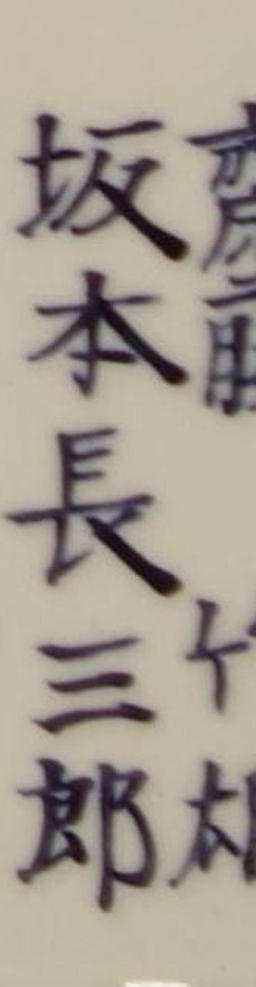坂本長三郎
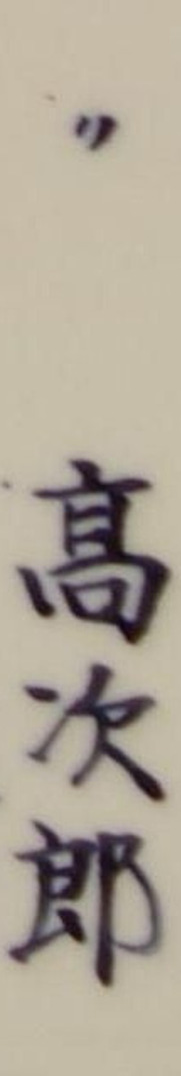高次郎
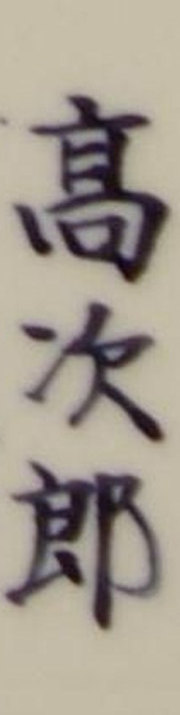高次郎
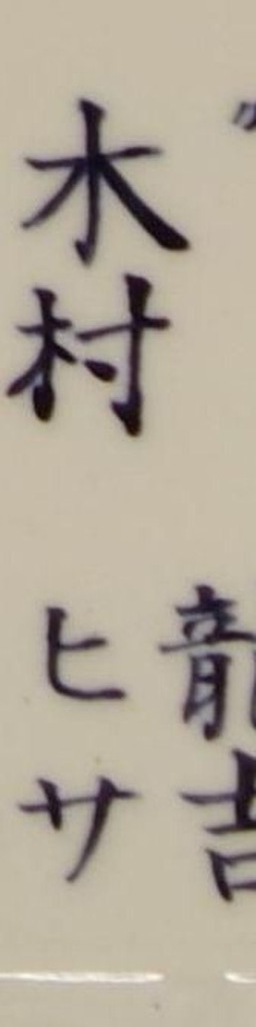木村ヒサ
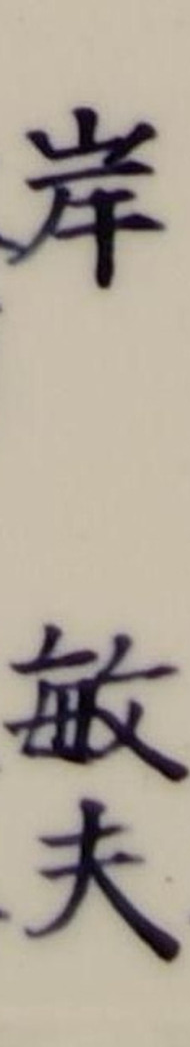岸敏夫
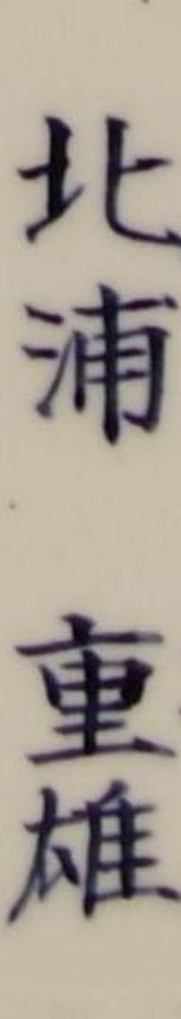北浦重雄
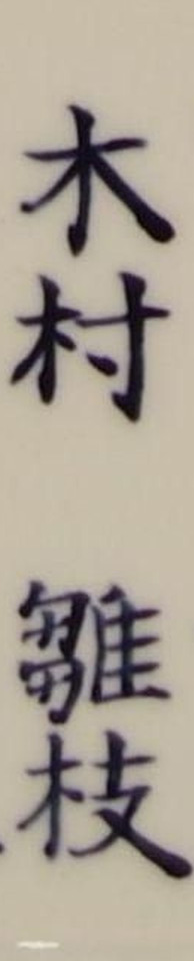木村雛枝
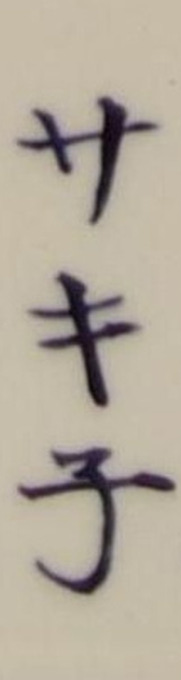サキ子
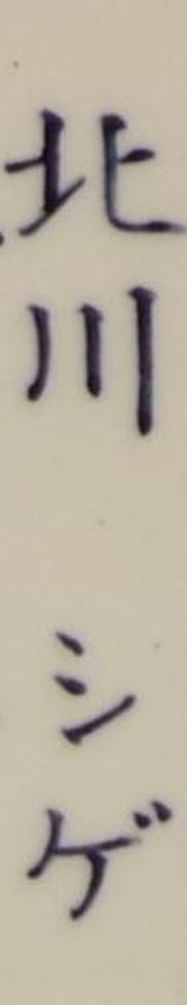北川シゲ
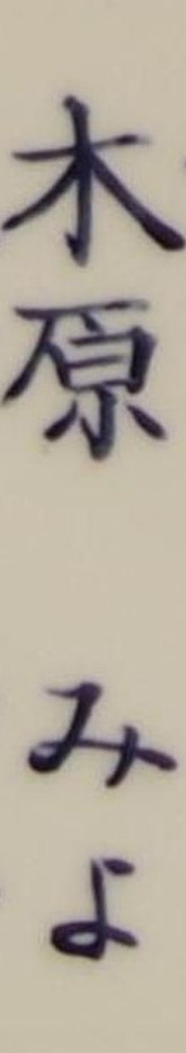木原みよ
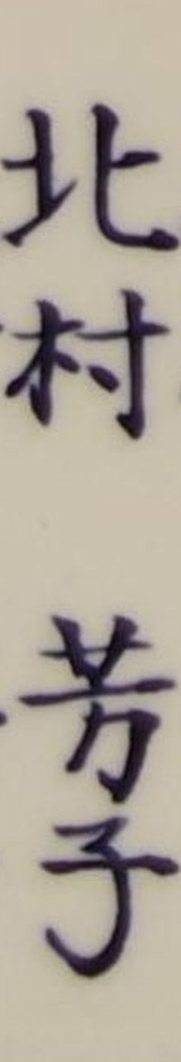北村芳子
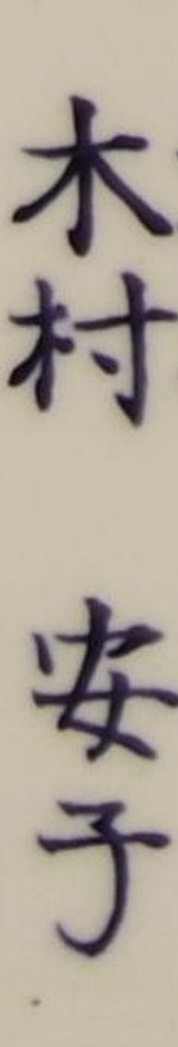木村安子

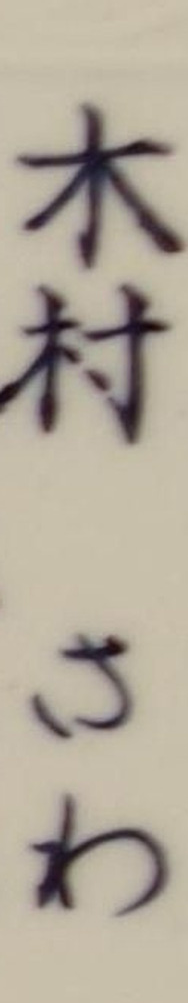木村さわ
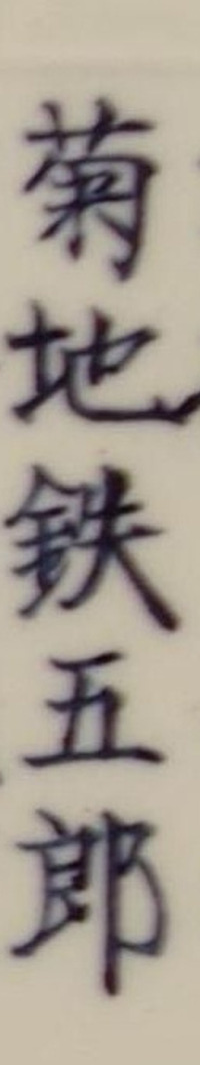菊地鉄五郎
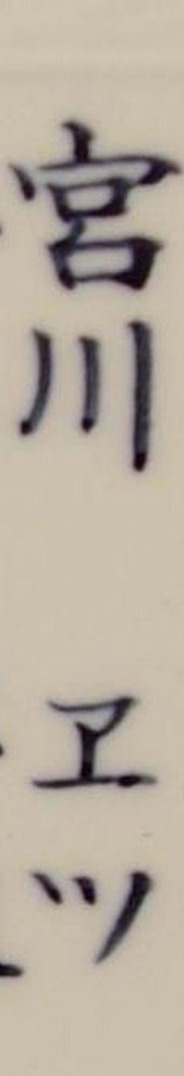宮川エツ
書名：E~L
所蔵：高野山金剛峯寺
